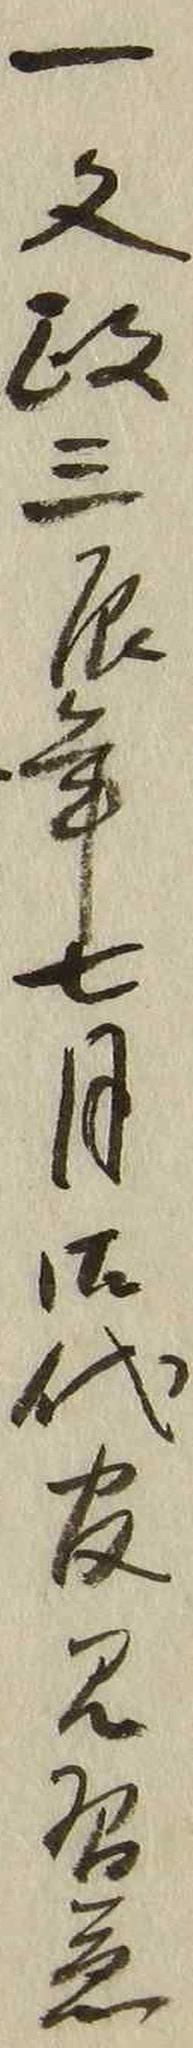一文政三辰年七月御代官見習兼
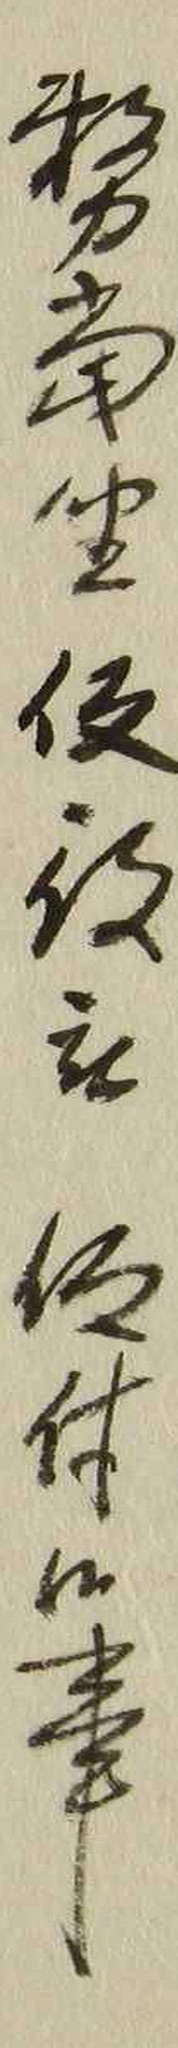務当坐仮役被仰付候事
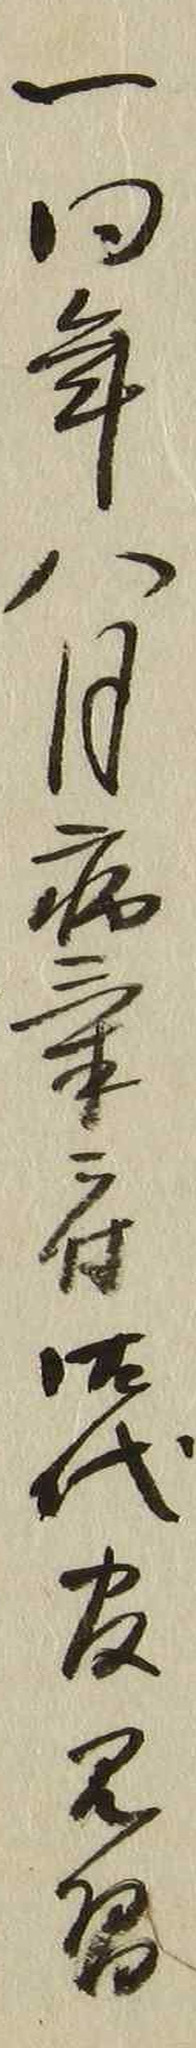一同年八月病気ニ付御代官見習
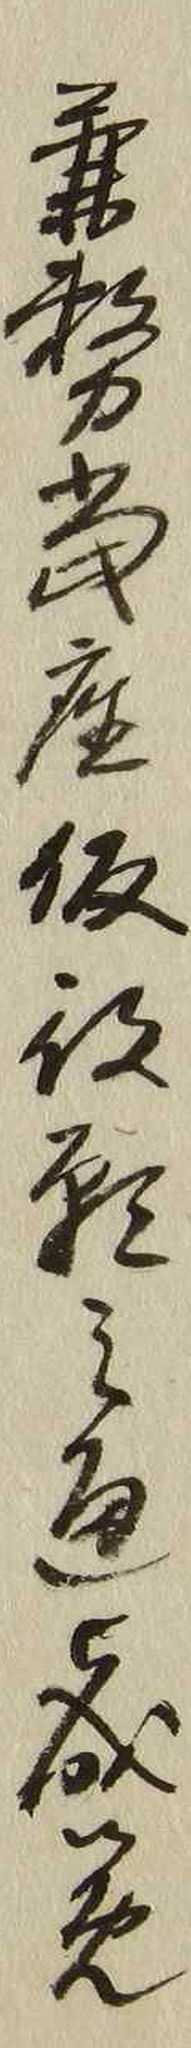兼務当座仮役願之通被成御免
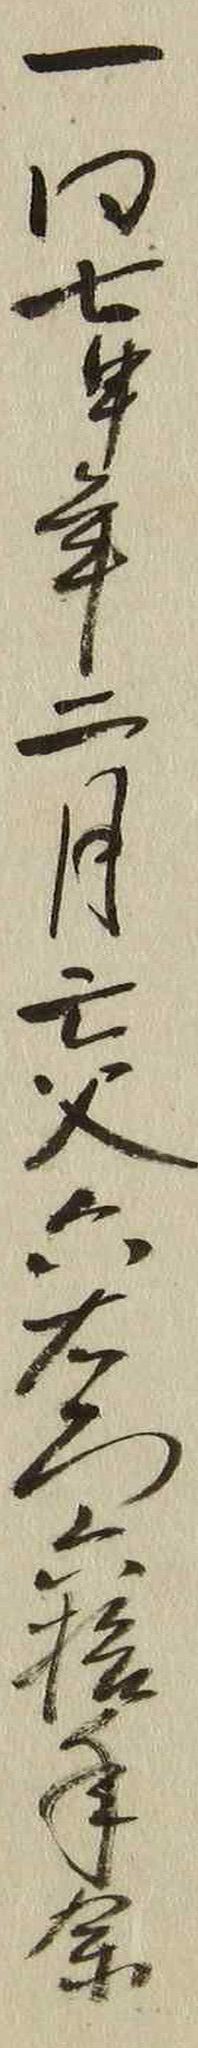一同七申年二月亡父六右衛門六拾年余
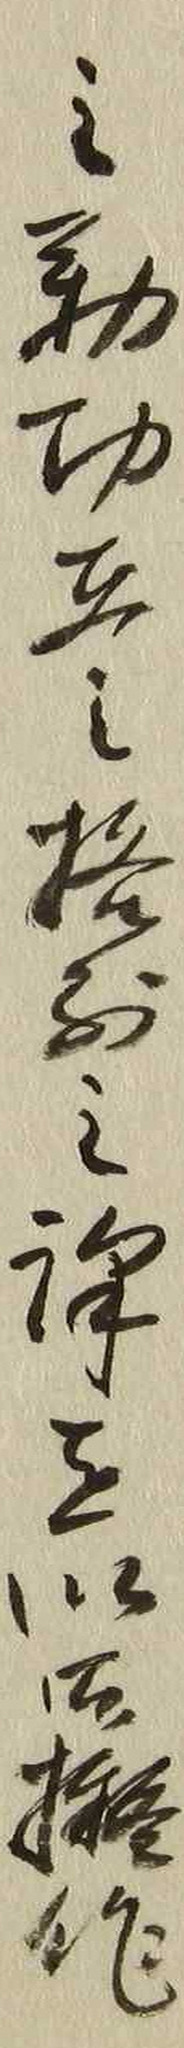之勤功在之格別之訳を以御擬作
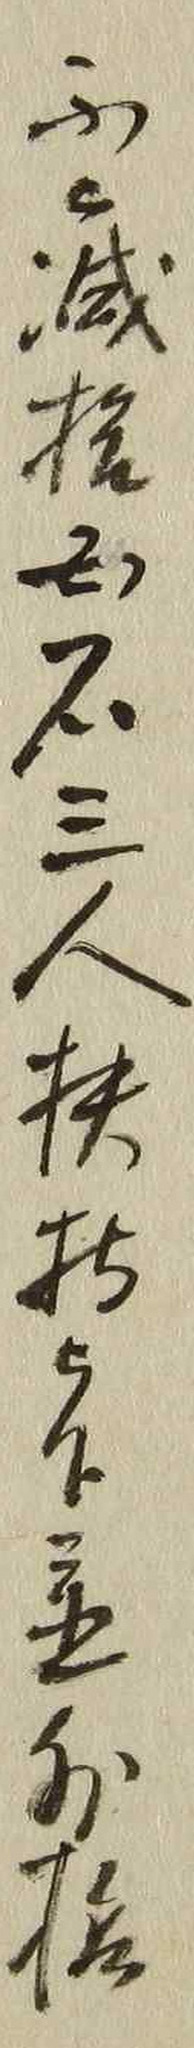不被減拾五石三人扶持被下置外様
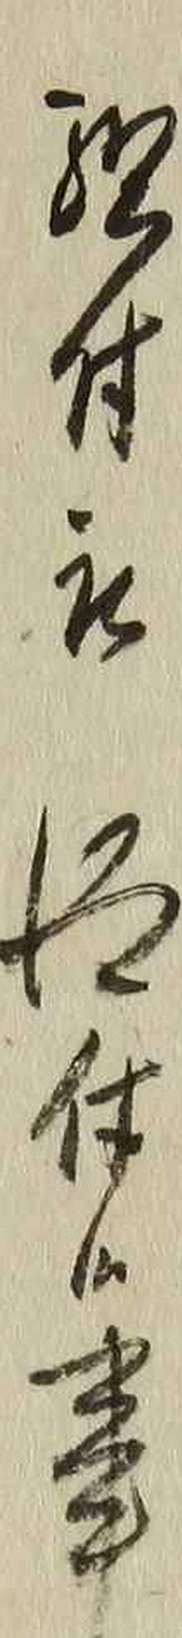組付被仰付候事
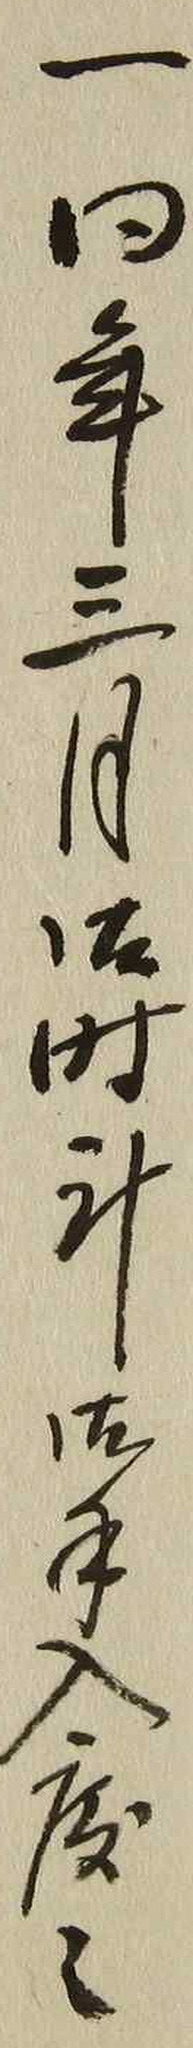一同年三月御時計御手入度々
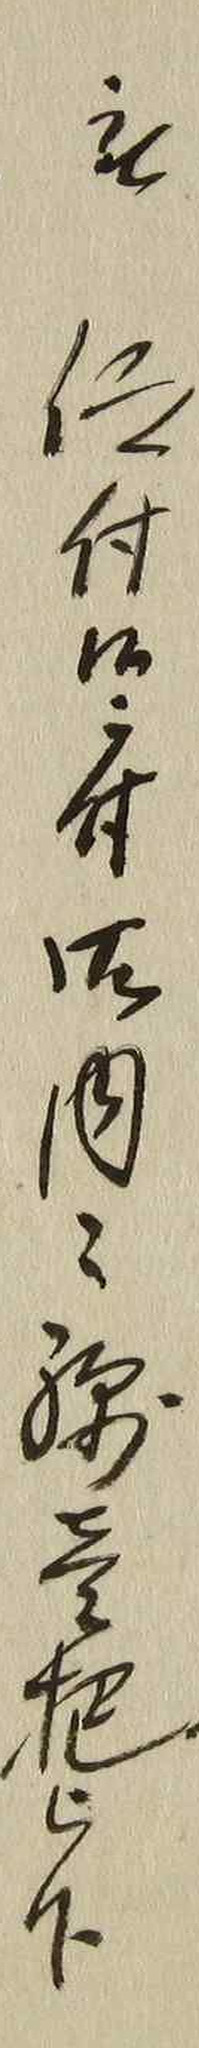被仰付候ニ付御内々錦壱把被下

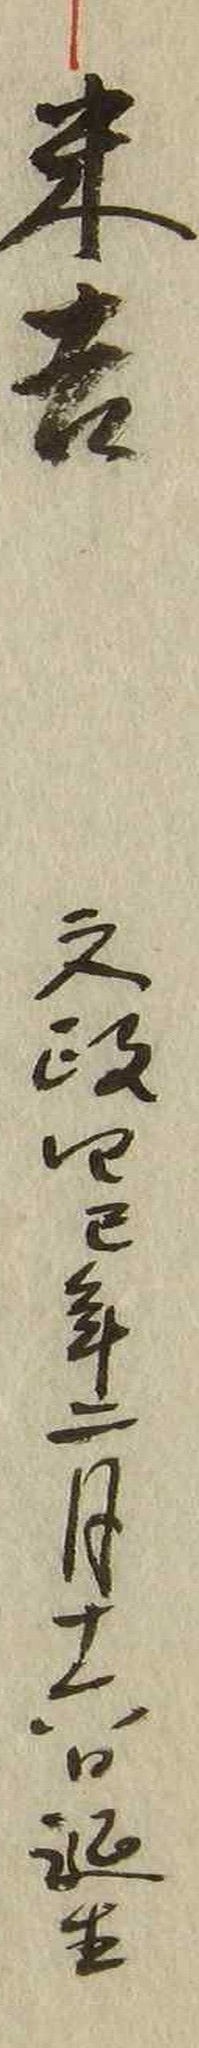米吉文政四巳年二月十六日誕生
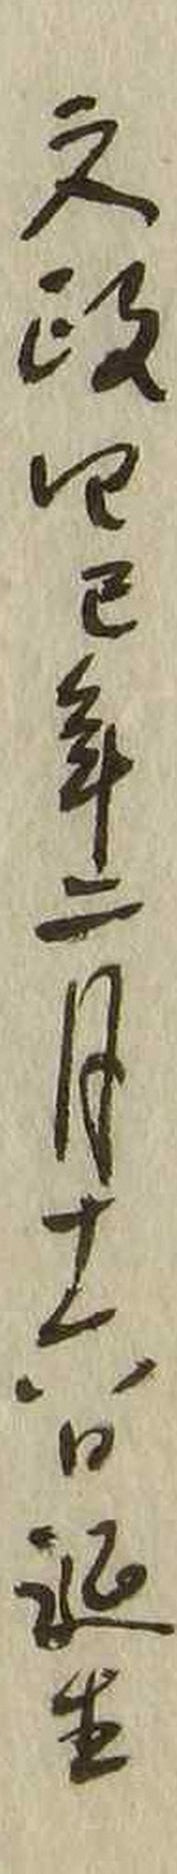米吉文政四巳年二月十六日誕生
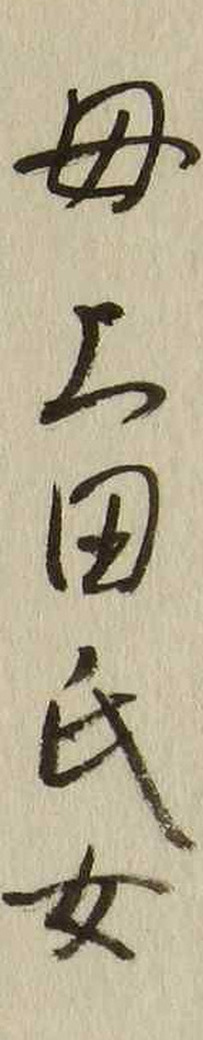母上田氏女
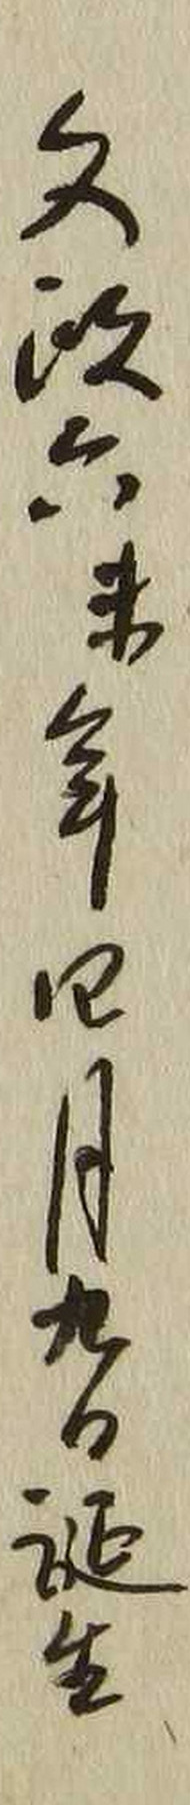女文政六未年四月九日誕生
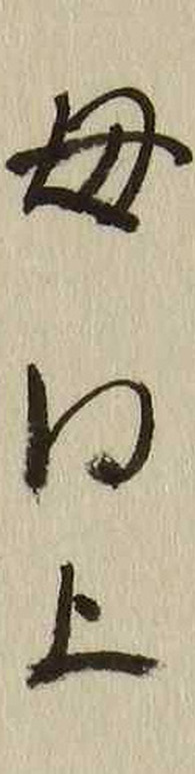母同上

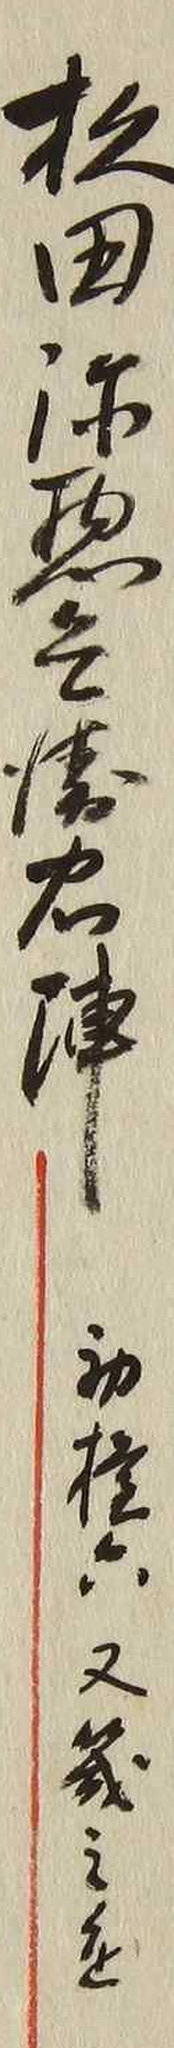杉田弥惣兵衛忠陣初権六又幾之進
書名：諸士系譜　巻之359　す之部9
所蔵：会津若松市立会津図書館
